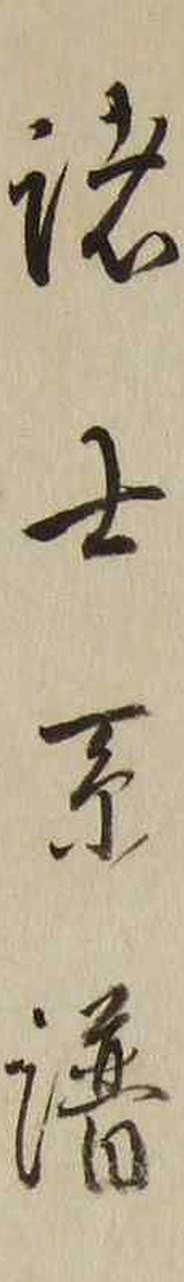諸士系譜

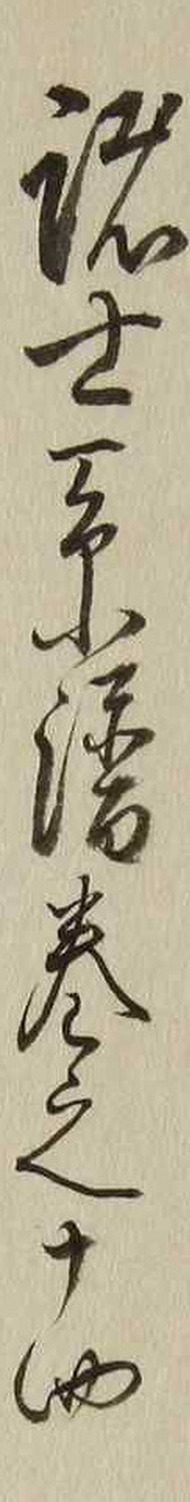諸士系譜巻之十四
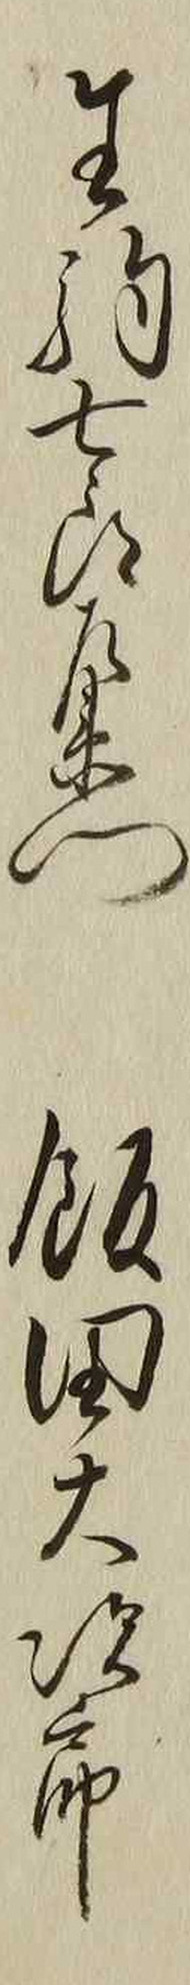生駒七郎左衛門飯田大次郎
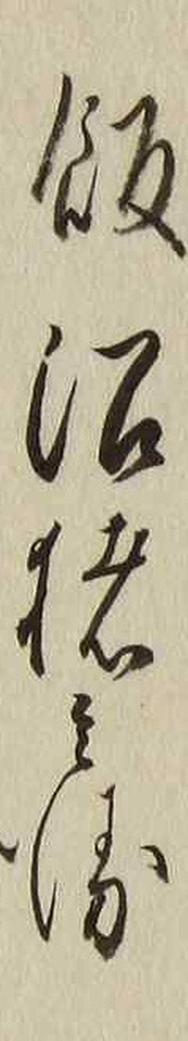飯沼猪兵衛

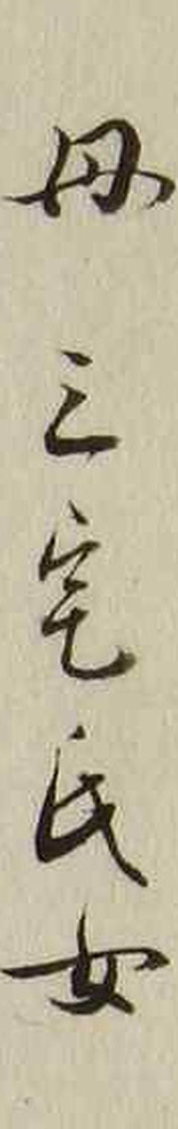母三宅氏女
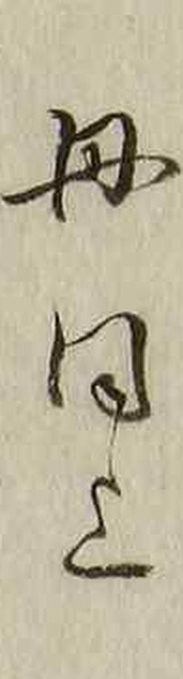母同上
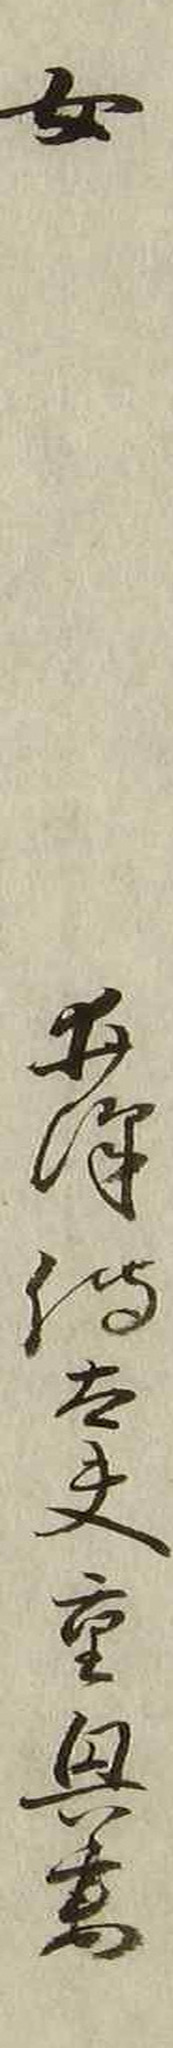女井沢伝太夫重興妻
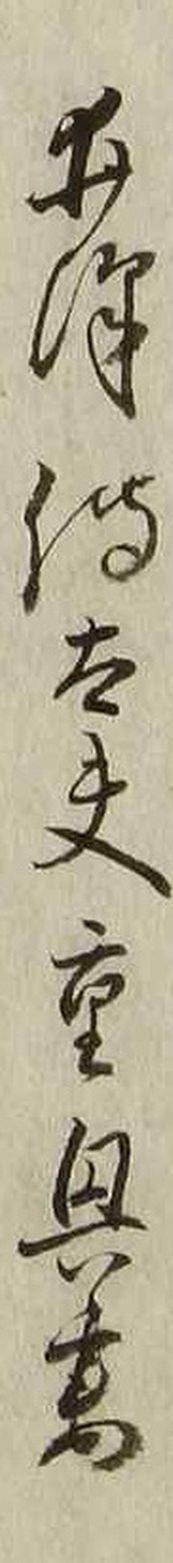女井沢伝太夫重興妻
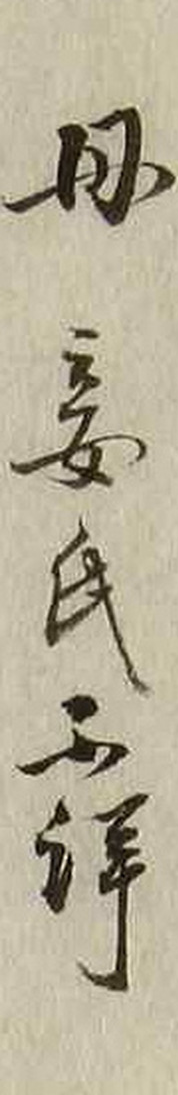母妻氏不詳
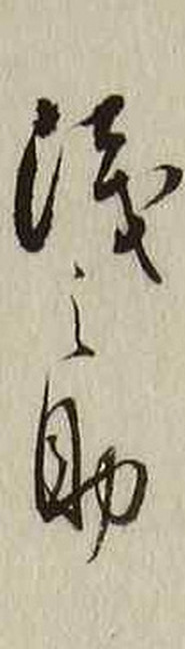浅之助
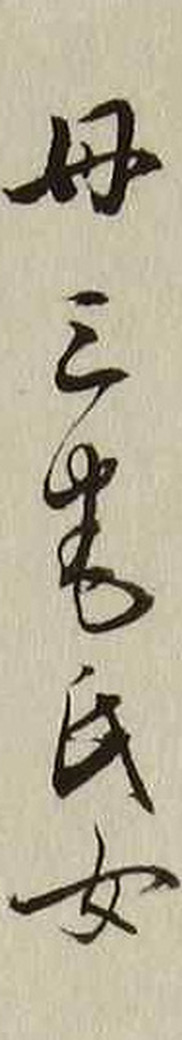母三宅氏女
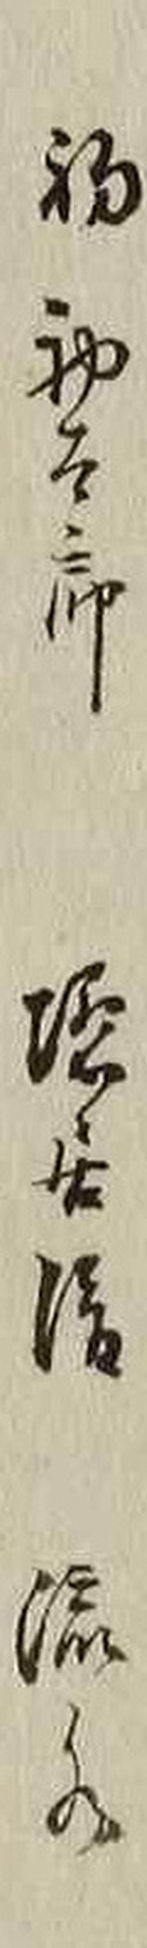初初太郎隠居後流水
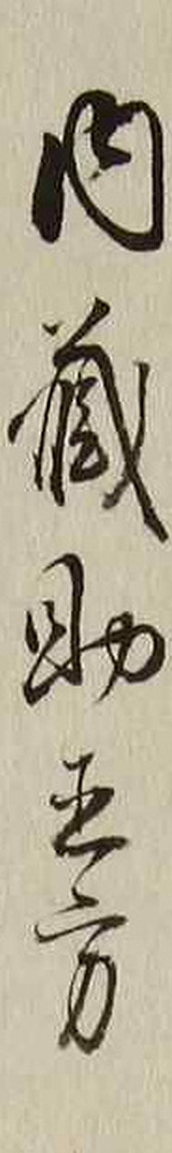内蔵助直方
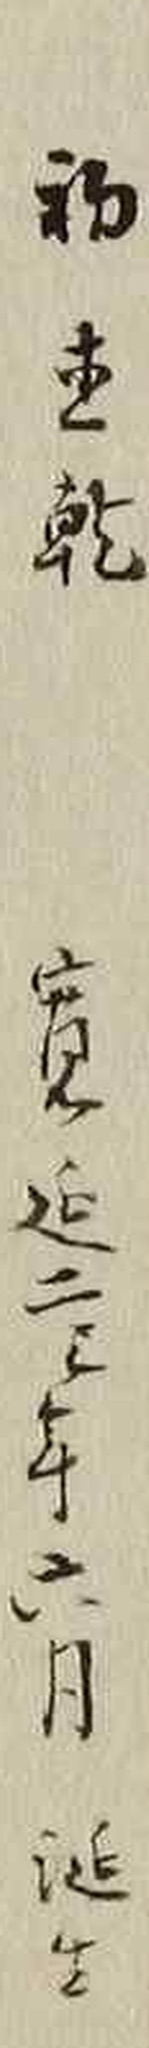初直乾寛延二巳年六月誕生
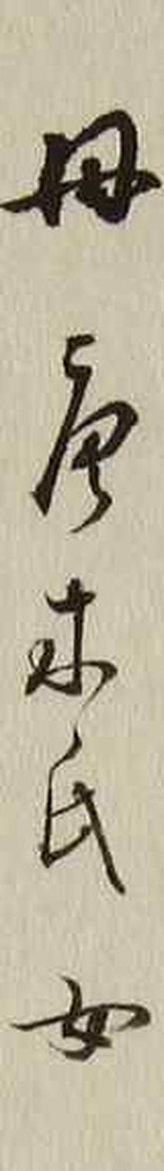母唐木氏女
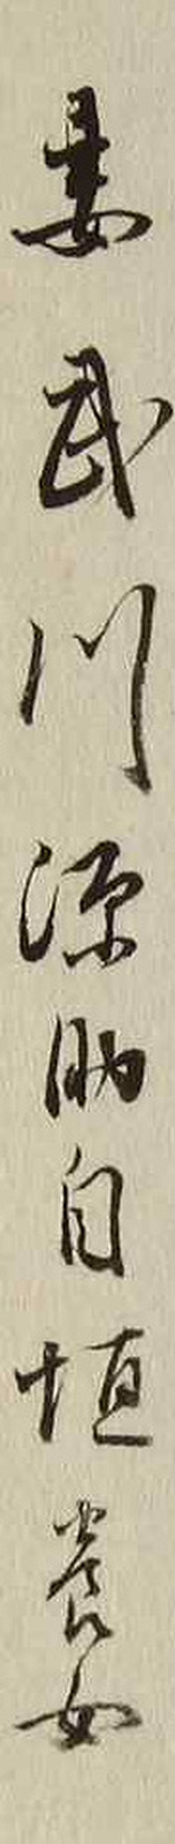妻武川源助自恒養女
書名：諸士系譜　巻之14　い之部14
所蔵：会津若松市立会津図書館
